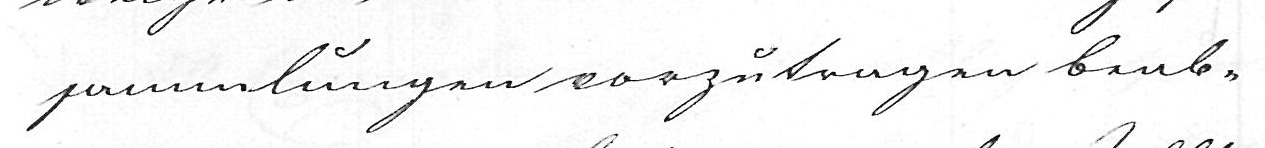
sammlungen vorzutragen beab-
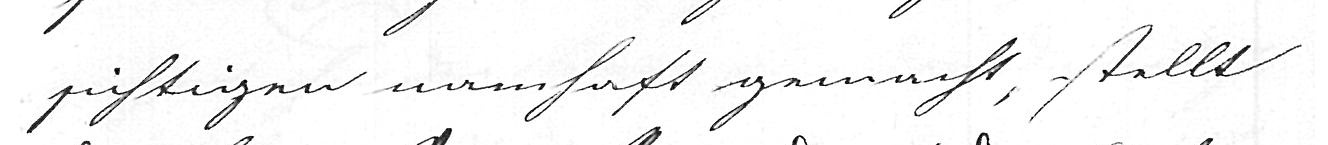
sichtigen namhaft gemacht, stellt
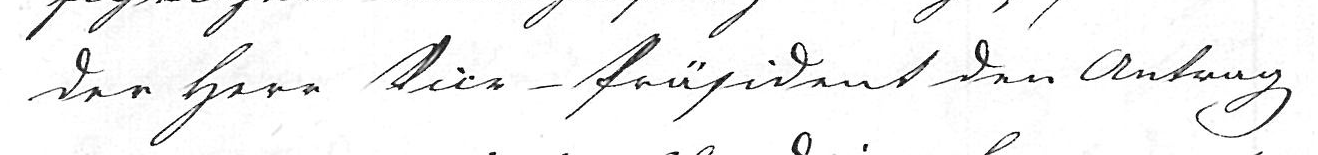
der Herr Vice-Präsident den Antrag
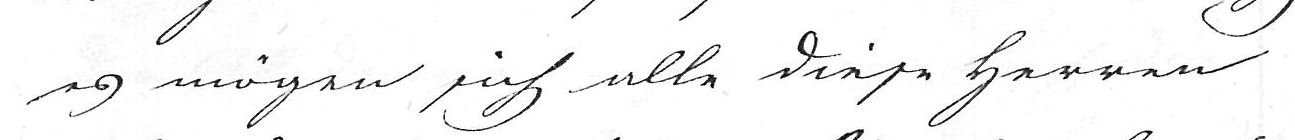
es mögen sich alle diese Herren
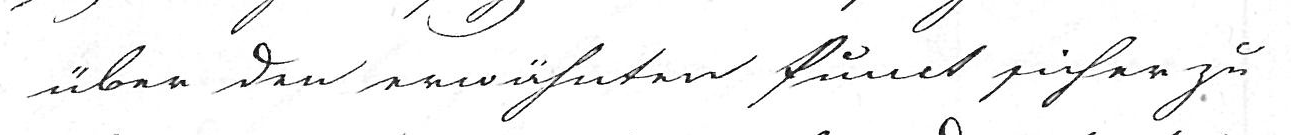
über den erwähnten Punct sicher zu
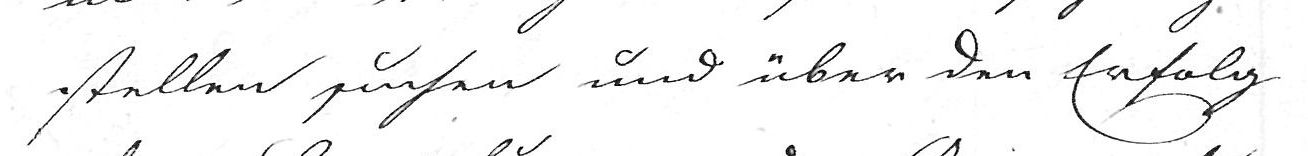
stellen suchen und über den Erfolg
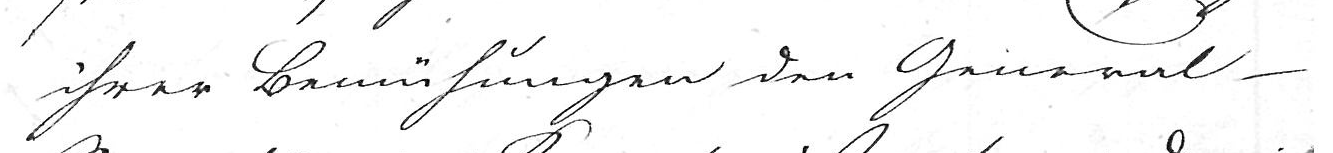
ihrer Bemühungen den General-
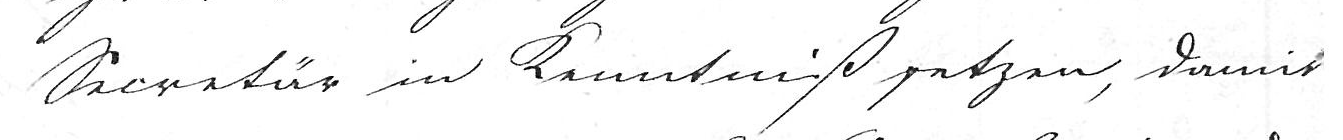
Secretär in Kenntniß setzen, damit
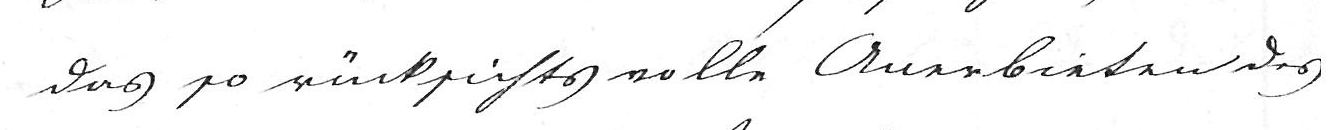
das so rücksichtsvolle Anerbieten des
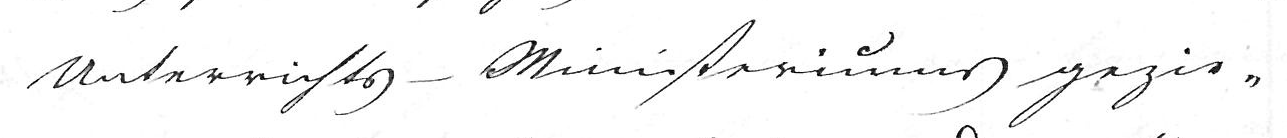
Unterrichts-Ministeriums gezie-
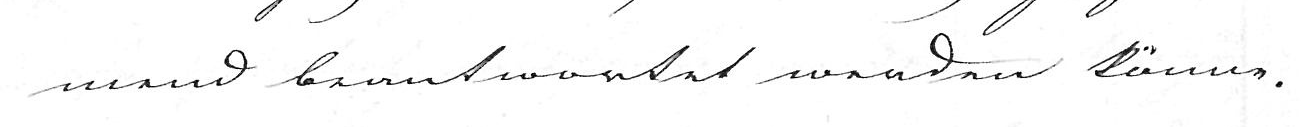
mend beantwortet werden könne.
